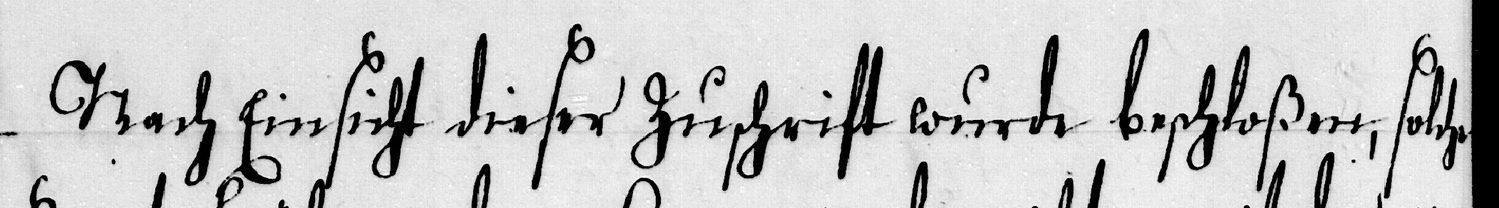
Nach Einsicht dieser Zuschrift wurde beschloßen, sol¬
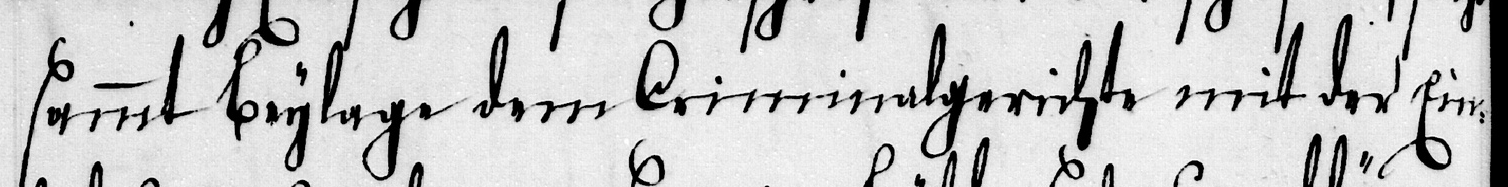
sammt Beylage dem Criminalgerichte mit der Ein¬
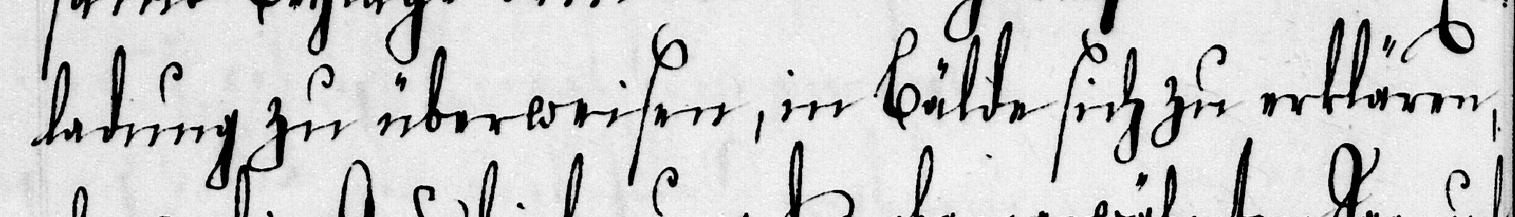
ladung zu überweisen, in Bälde sich zu erklären,
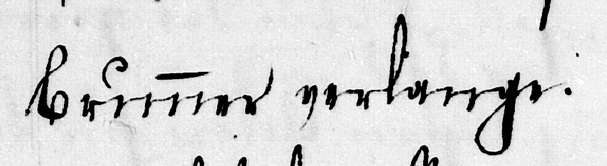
Brunner verlange.
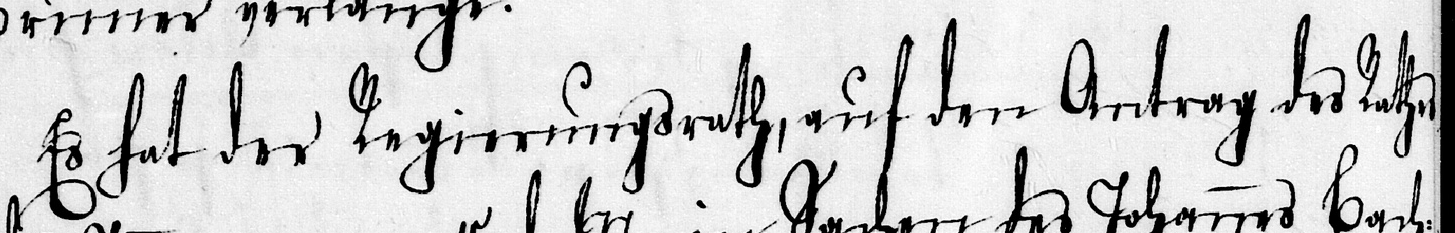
Es hat der Regierungsrath, auf den Antrag des Rat¬
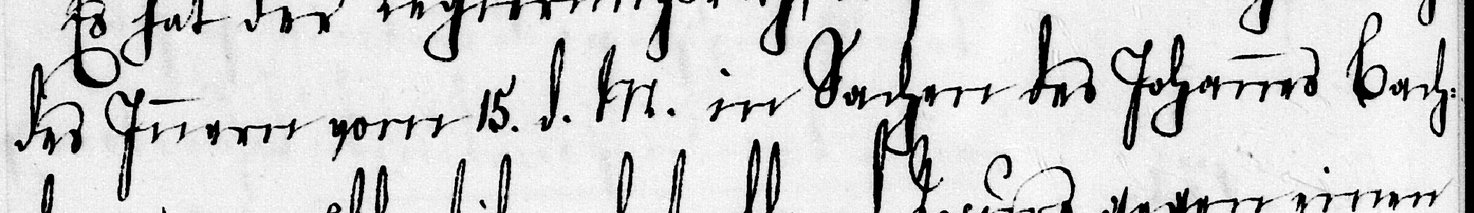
des Innern vom 15. d. M. in Sachen des Johannes Bach¬
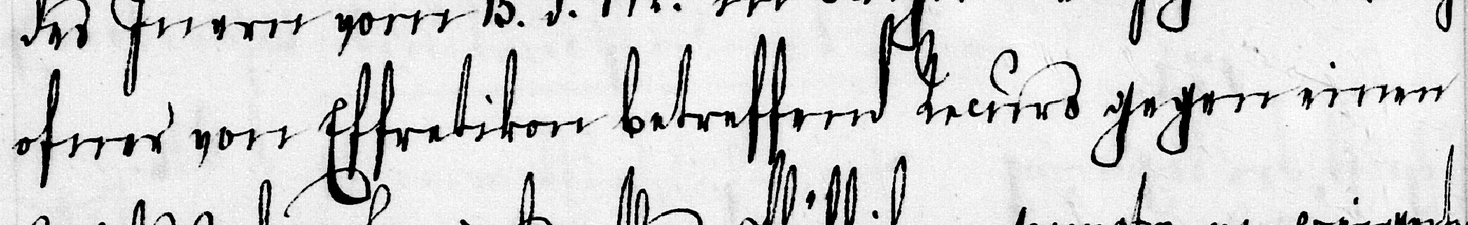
ofner von Effretikon betreffend Recurs gegen einen
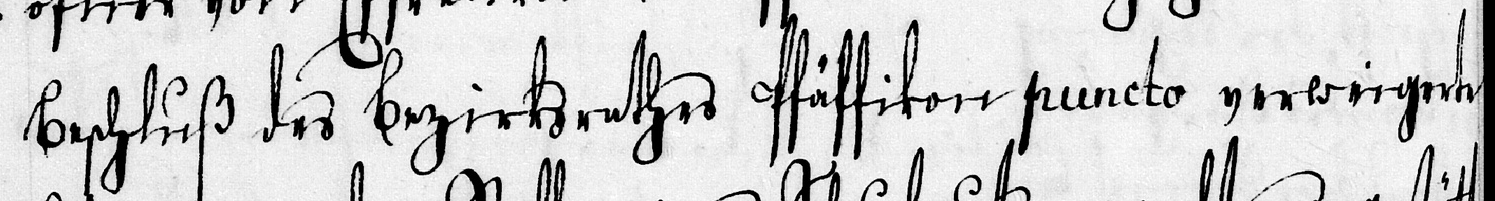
Beschluß des Bezirksrathes Pfäffikon puncto verweigerte
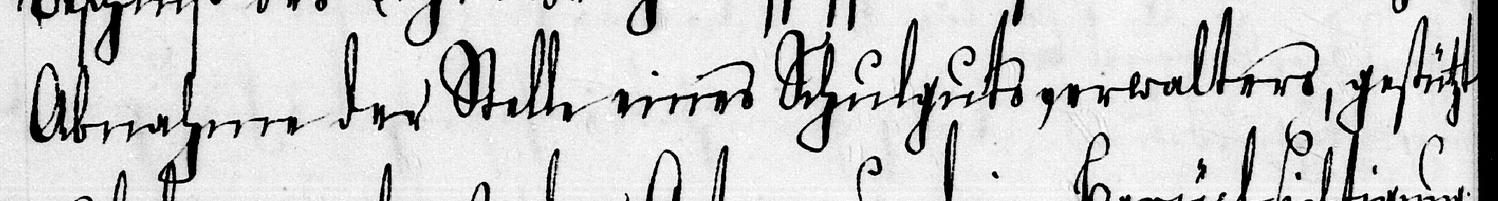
Abnahme der Stelle eines Schulgutsverwalters, gestü¬
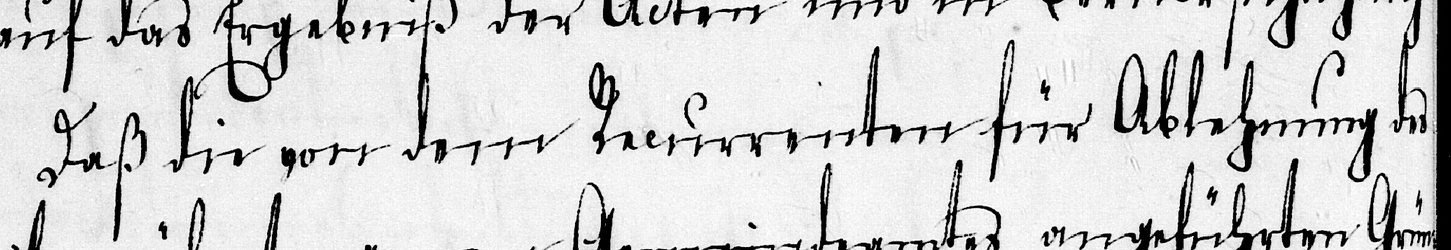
Daß die von dem Recurrenten für Ablehnung d¬
